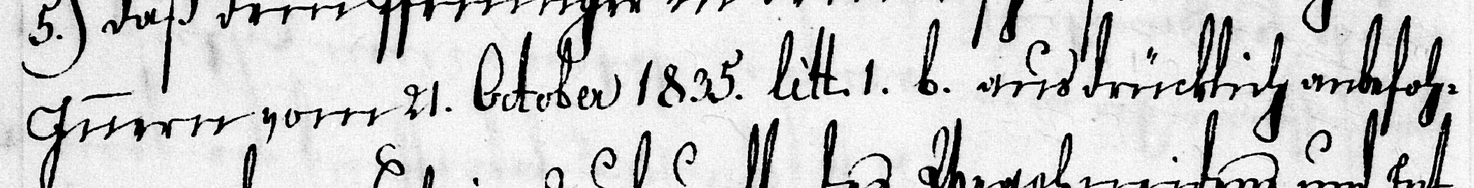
Innern vom 21. October 1835. litt. 1. b. ausdrücklich anbefoh¬
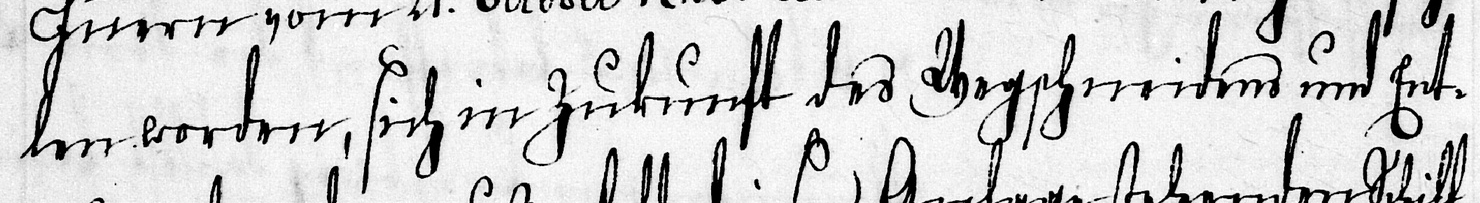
len worden, sich in Zukunft des Wegschneidens und Ent¬
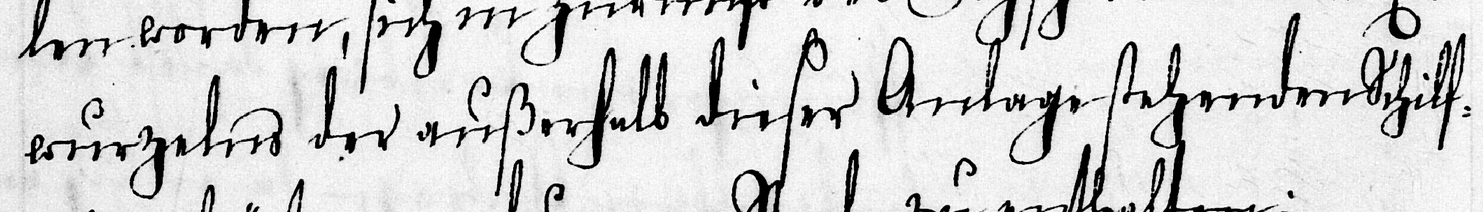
wurzelns der außerhalb dieser Anlage stehenden Schilf¬
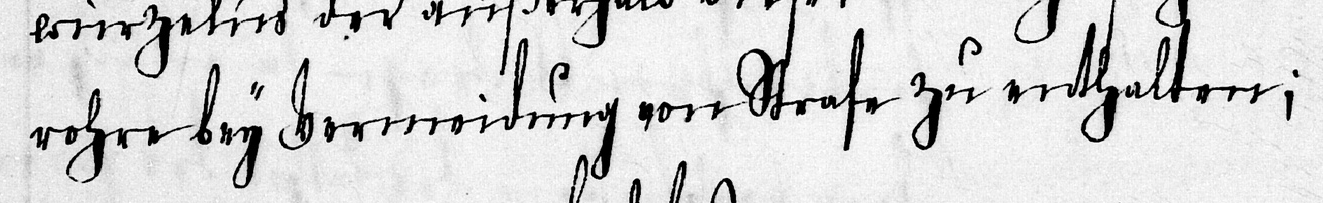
rohre bey Vermeidung von Strafe zu enthalten;
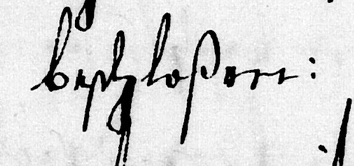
beschloßen:
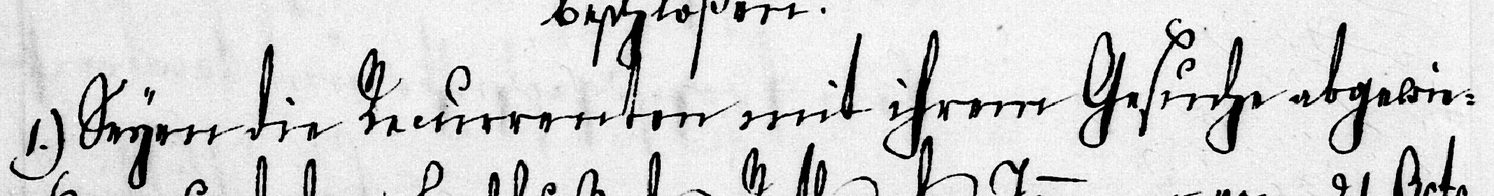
1.) Seyen die Recurrenten mit ihrem Gesuche abgewie¬
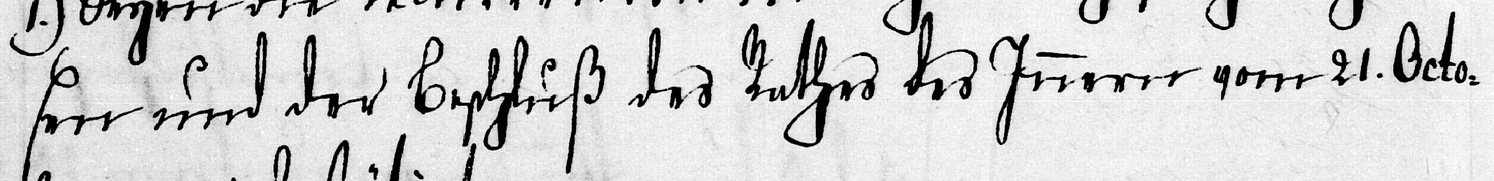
sen und der Beschluß des Rathes des Innern vom 21. Octo¬
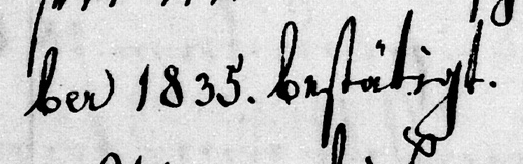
ber 1835. bestätigt.
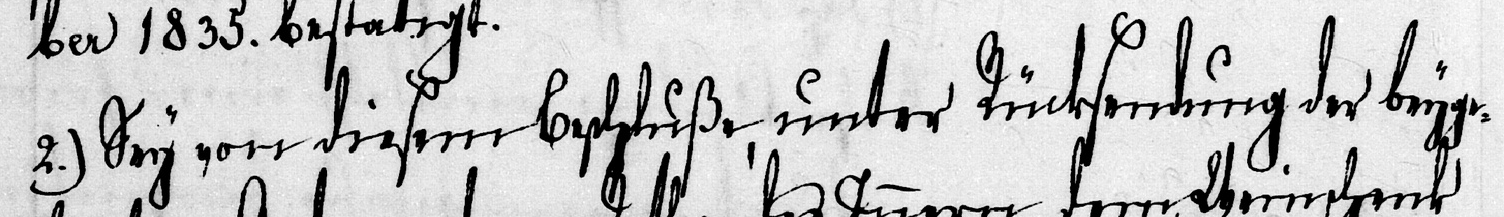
2.) Sey von diesem Beschluße, unter Rücksendung der beyge¬
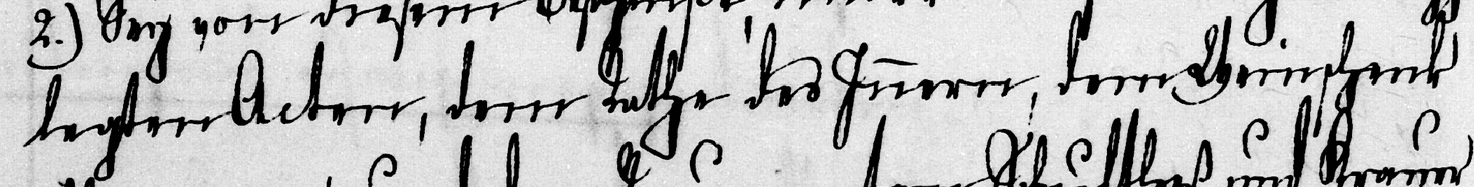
legten Acten, dem Rathe des Innern, dem Weinschenk
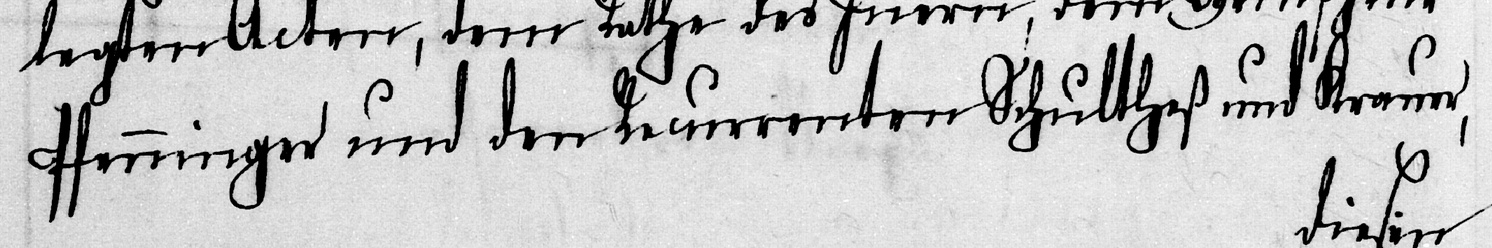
Pfenninger und den Recurrenten Schultheß und Krauer,
